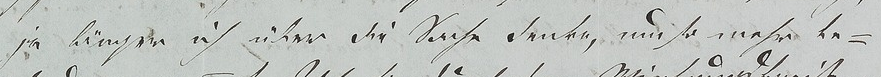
je länger ich über die Sache denke, um so mehr be-
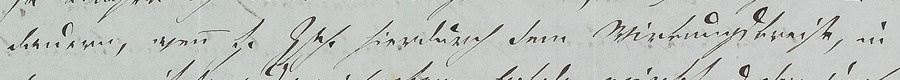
dauern, wenn H. Zsch. hierdurch dem Wirkungskreise, in
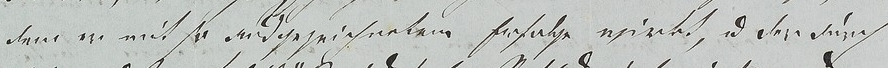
dem er mit so ausgezeichnetem Erfolge wirkt, u der durch
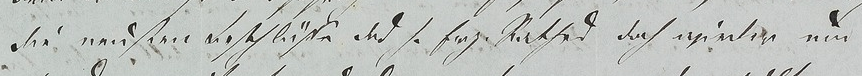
die neusten Beschlüsse des h. Erz.Rathes doch wieder um
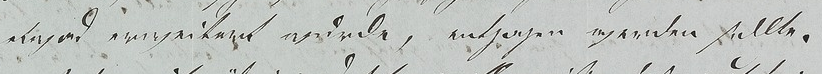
etwas erweitert wurde, entzogen werden sollte.
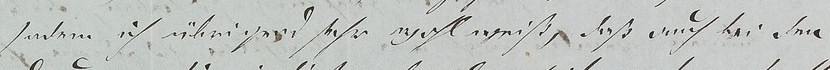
Indem ich übrigens sehr wohl weiß, daß auch bei den
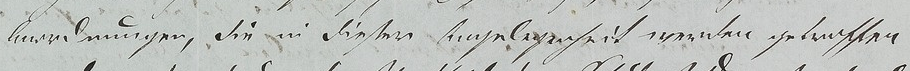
Anordnungen, die in dieser Angelegenheit werden getroffen
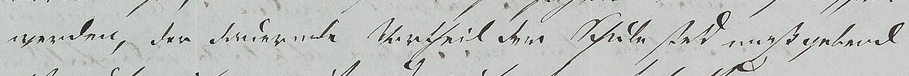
werden, der dauernde Vortheil der Schule stets maßgebend
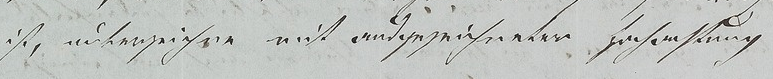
ist, unterzeichne mit ausgezeichneter Hochachtung
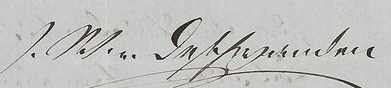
J. W. v. Deschwanden
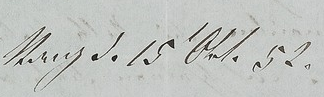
Stanz d. 15t Okt. 52.
